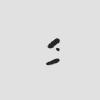余
